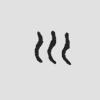川
